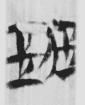班
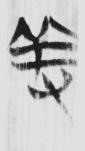羞
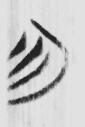勿
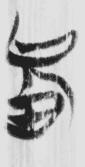{田允}
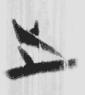之
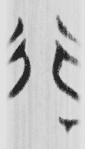行
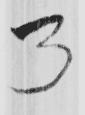乃
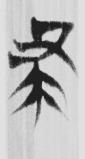聿
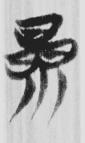參
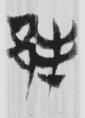邦
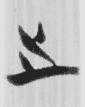之
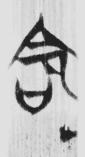命
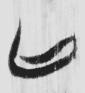㠯（以）
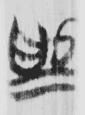爲
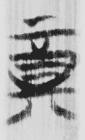奠
